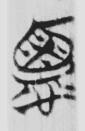{鹵皿}
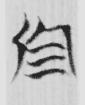於
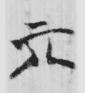亓
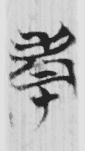考
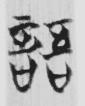語
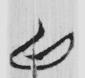㠯（以）
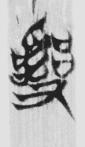{𤔔㗊}
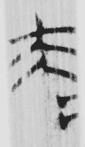夫=
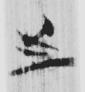之
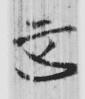正
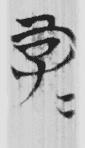乳=
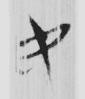女
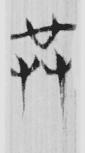共
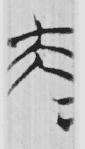夫=
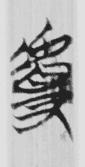虘B
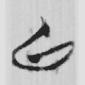㠯（以）
